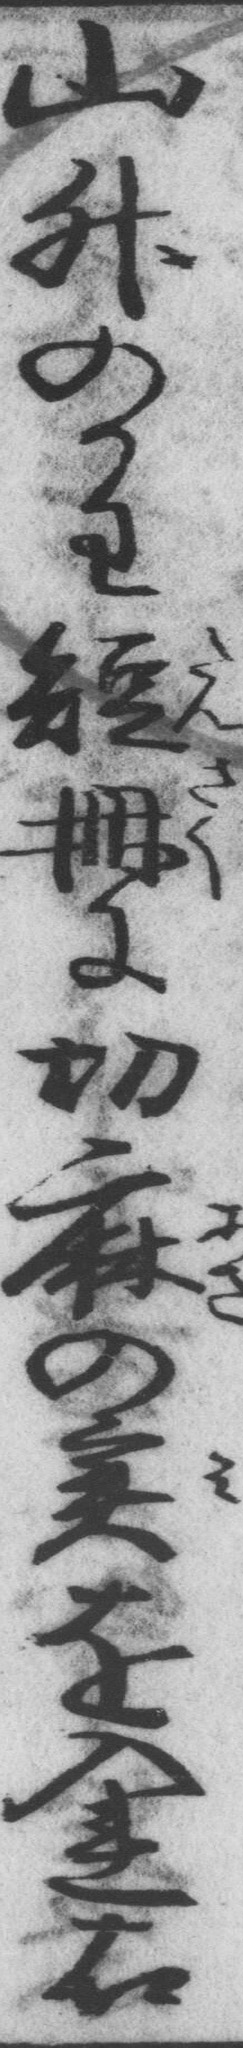山升のかわ短冊に切麻の実を入れ右
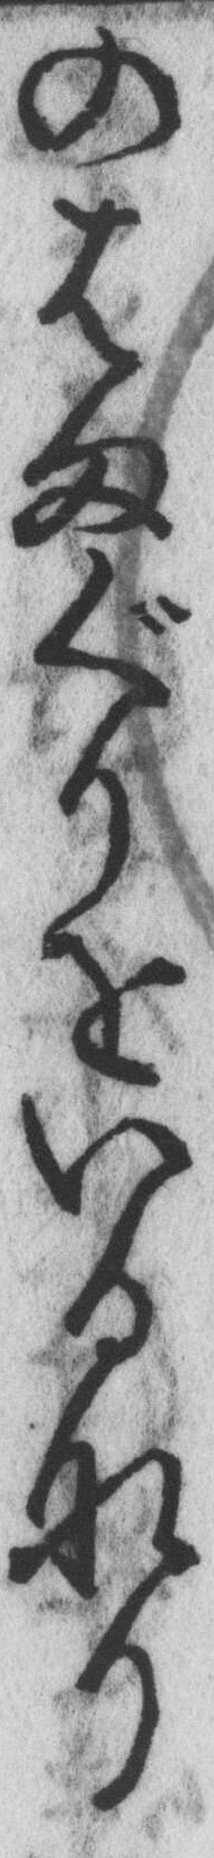のはまぐりをいるなり
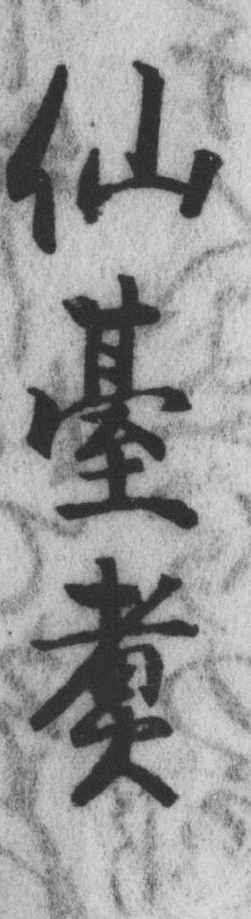仙台煮

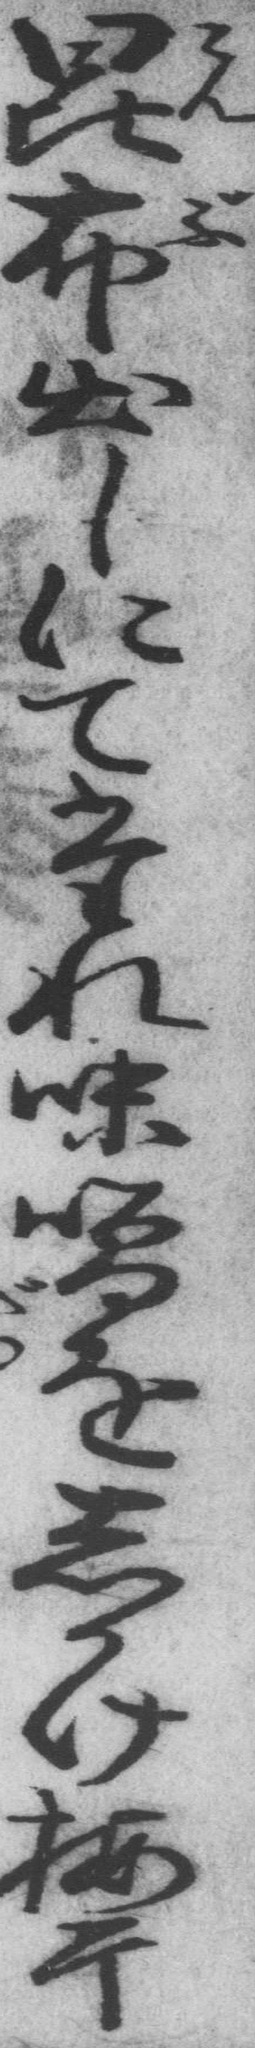昆布出しにてたれ味噌をしかけ梅干
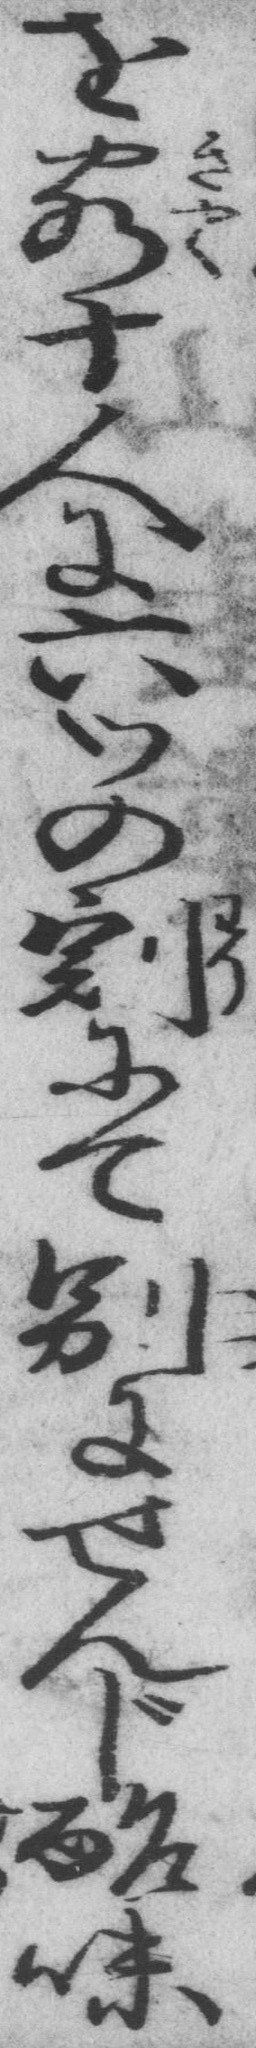を客十人に六ツの割にて別にせんじ酢味
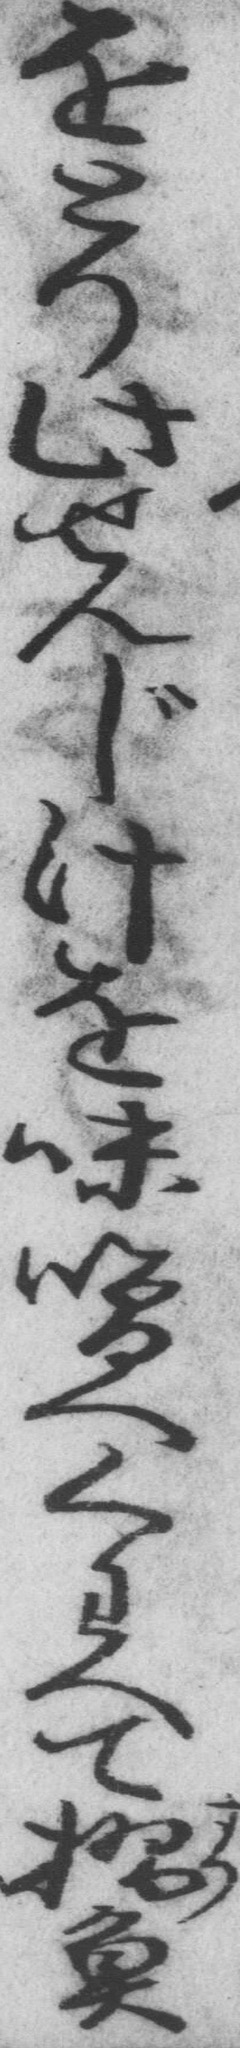をとり此せんじ汁を味噌へくわへて摺魚
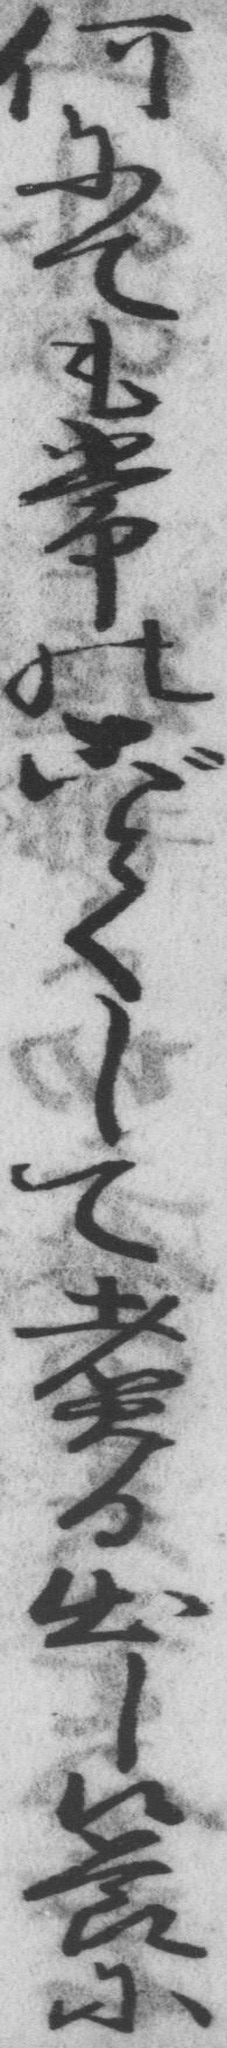何にても常のごとくして煮る出し候節に
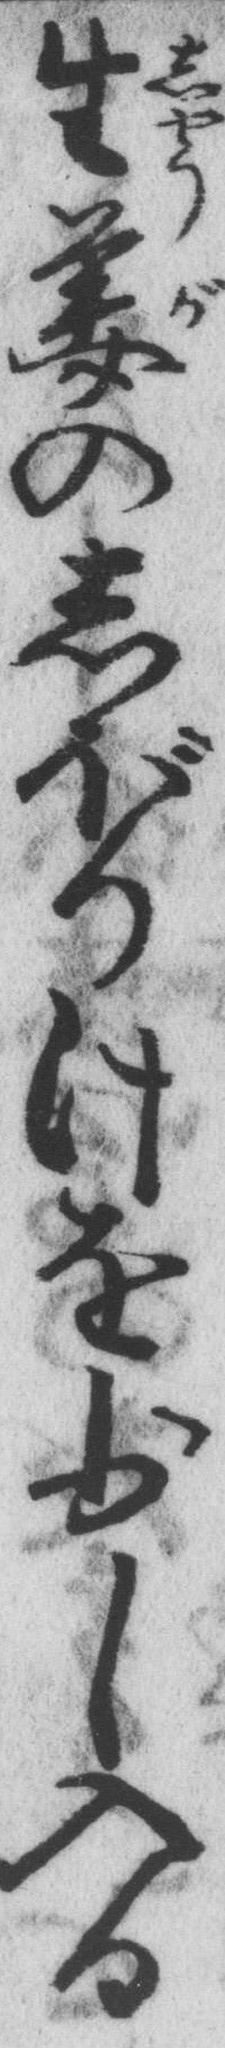生姜のしぼり汁を少し入る
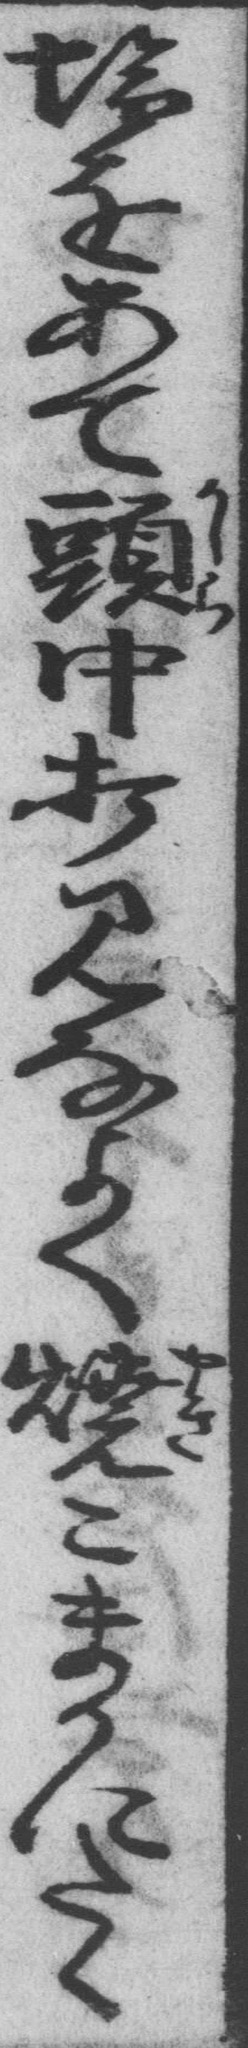塩をあて頭中打みなよく焼こまかにたゝ
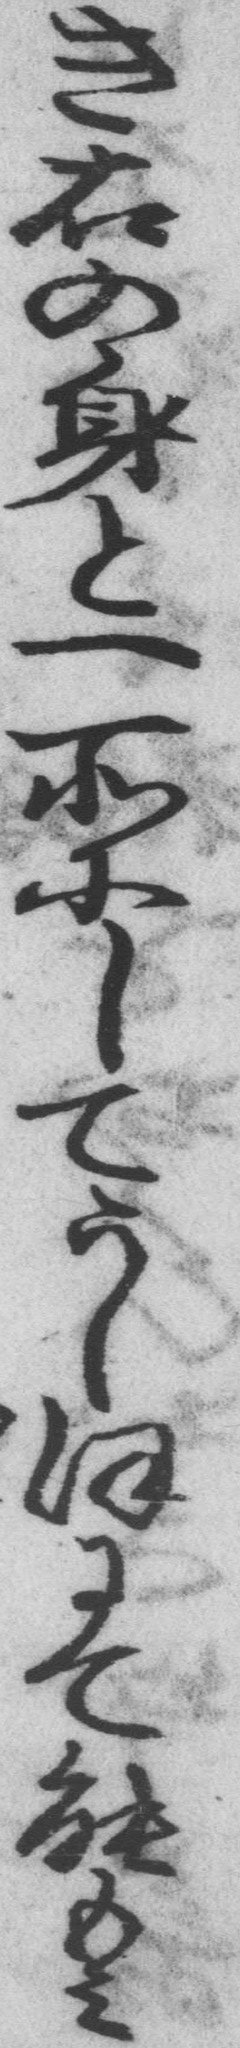き右の身と一所にしてうしほにて能もみ
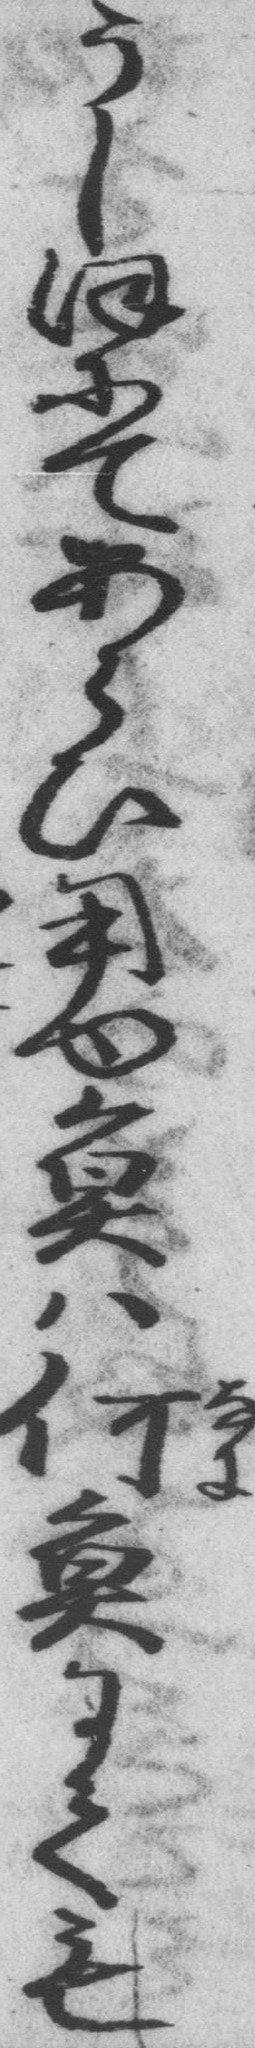うしほにてあらひ用ゆ魚は何魚にても
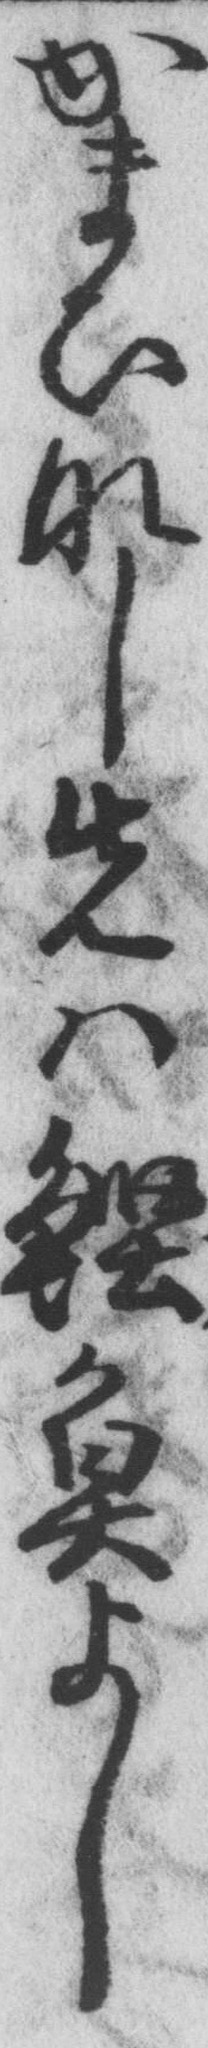かまひなし先は鰹魚よし
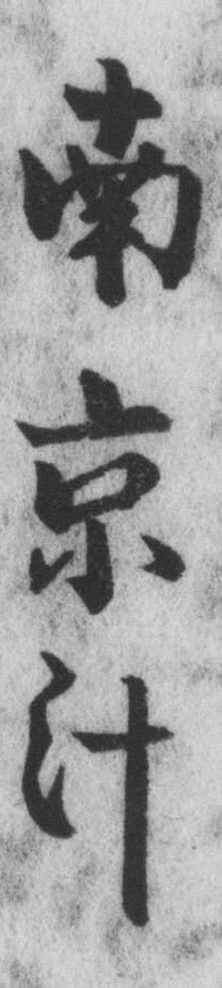南京汁
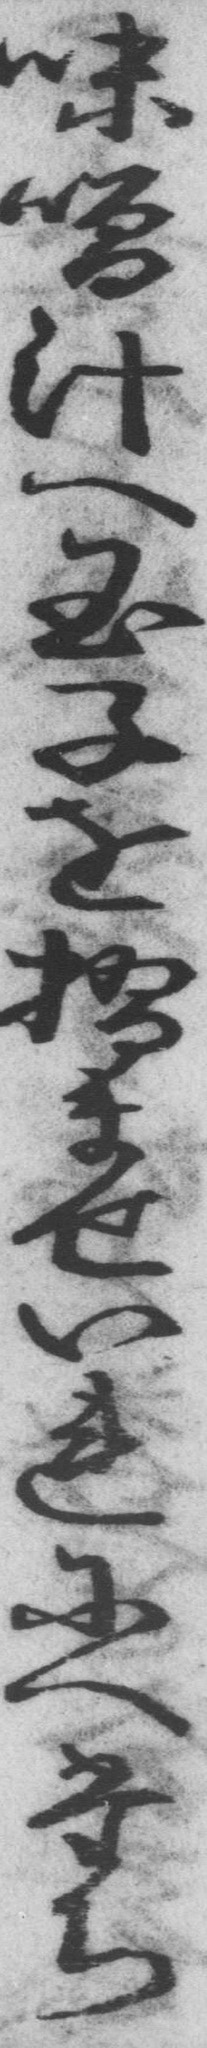味噌汁へ玉子を摺ませいれにへたち
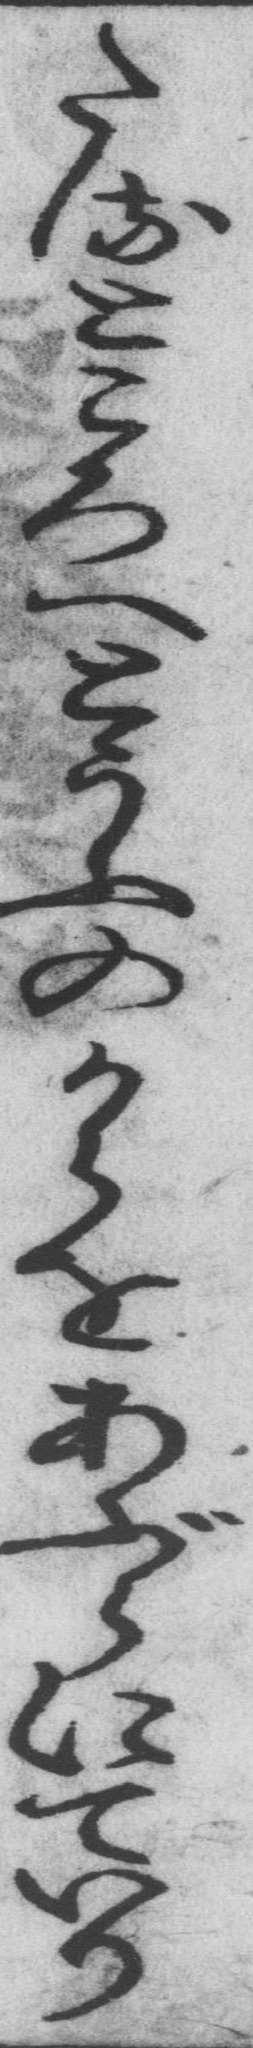たるところへとうふのからをあぶらにていり
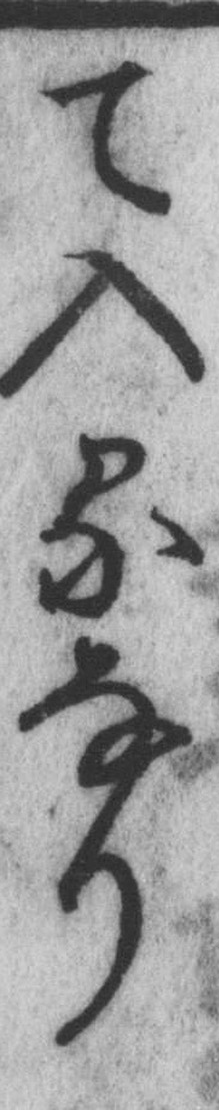て入るなり
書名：料理山海郷
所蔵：大阪府立大学学術情報センター 国文学研究資料館
